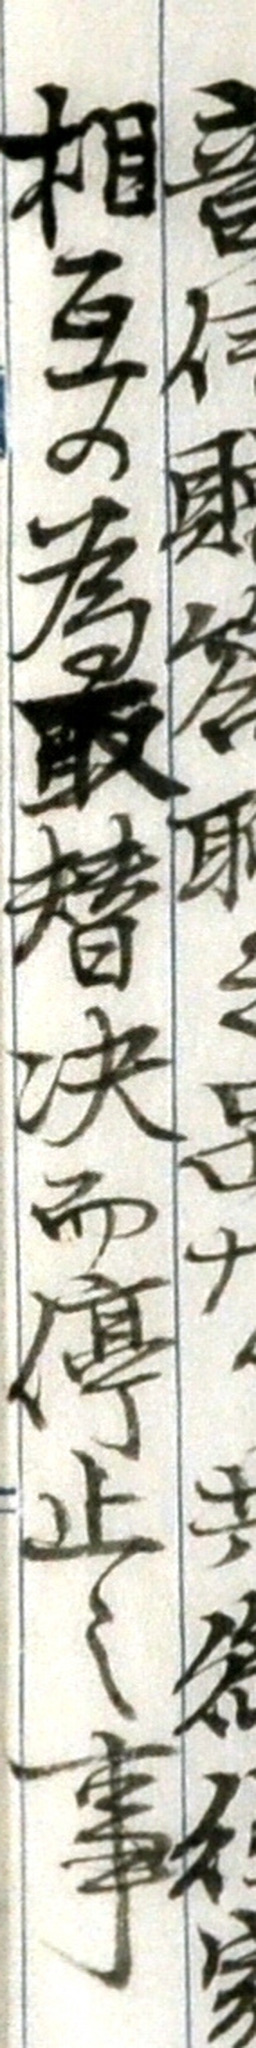相互の為取替決而停止之事

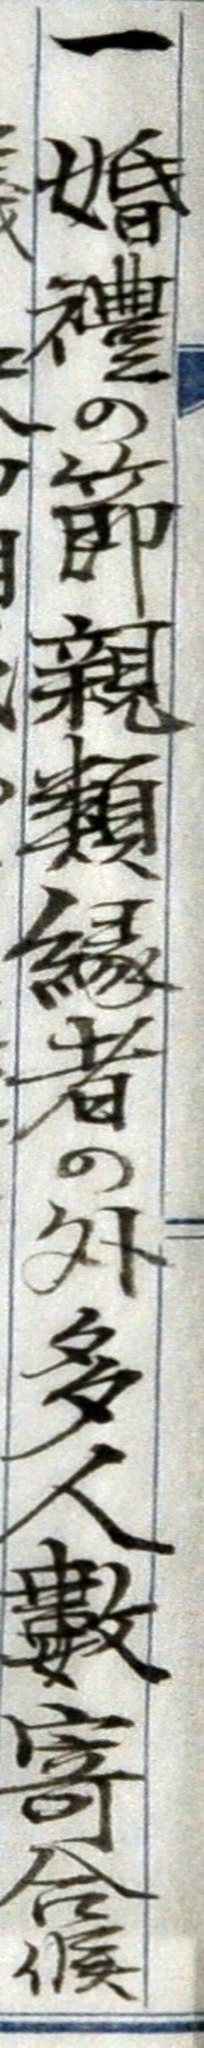一婚礼の節親類縁者の外多人数寄合候
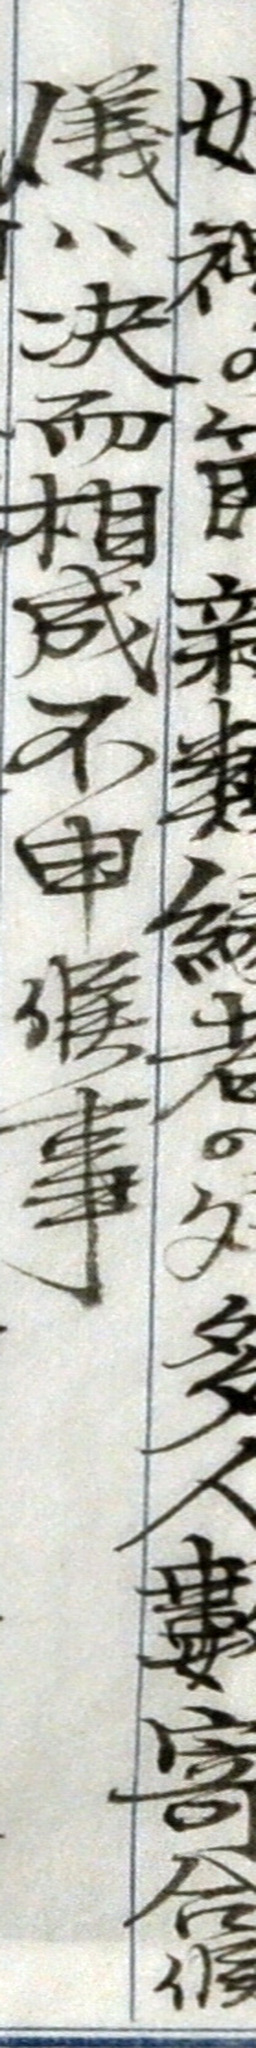儀ハ決而相成不申候事
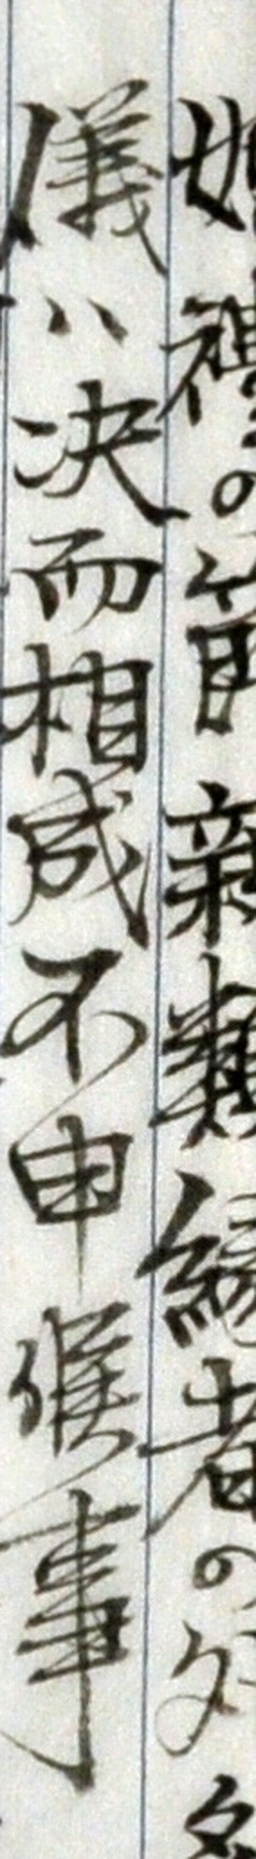儀ハ決而相成不申候事
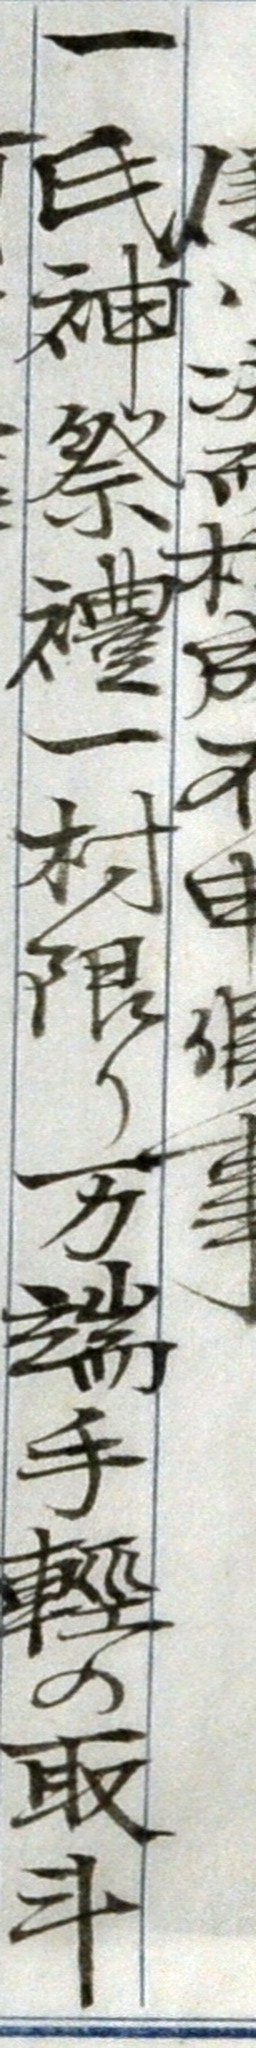一氏神祭礼一村限り万端手軽の取斗
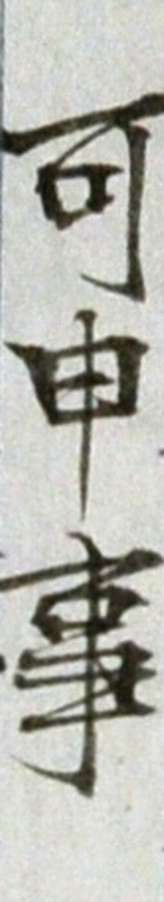可申事
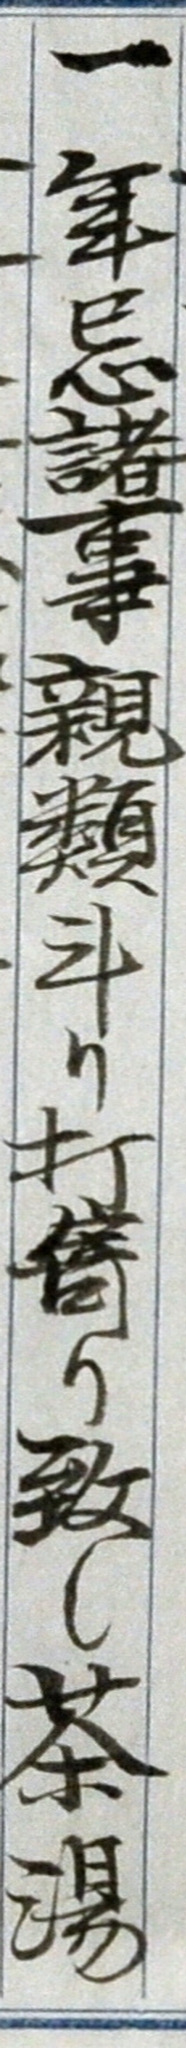一年忌諸事親類斗り打寄り致し茶湯
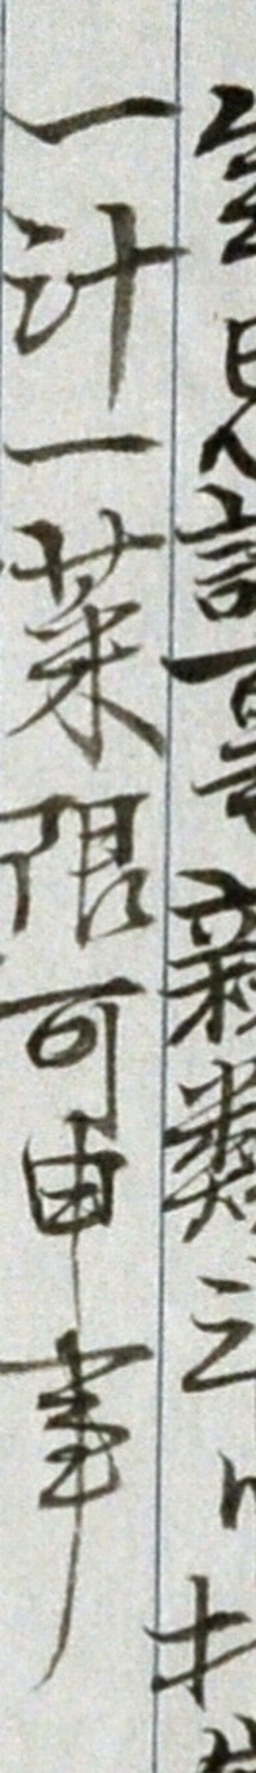一汁一菜限可申事
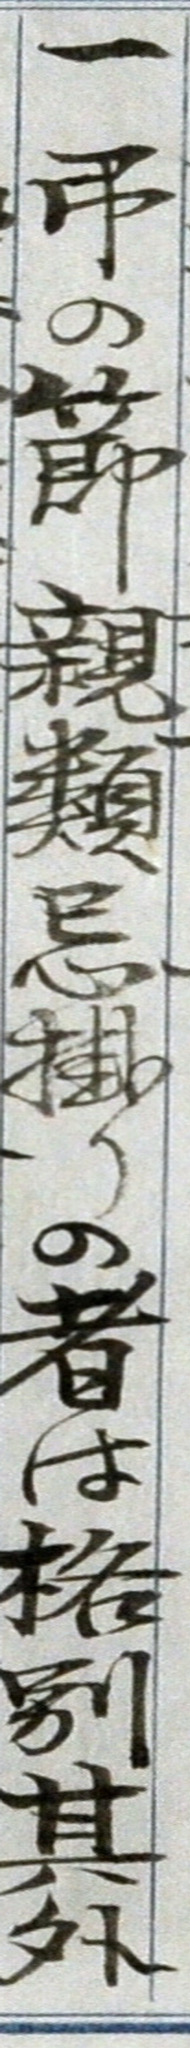一弔の節親類忌掛りの者は格別其外
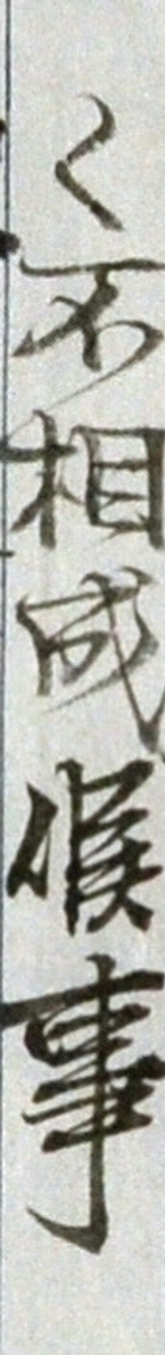く不相成候事
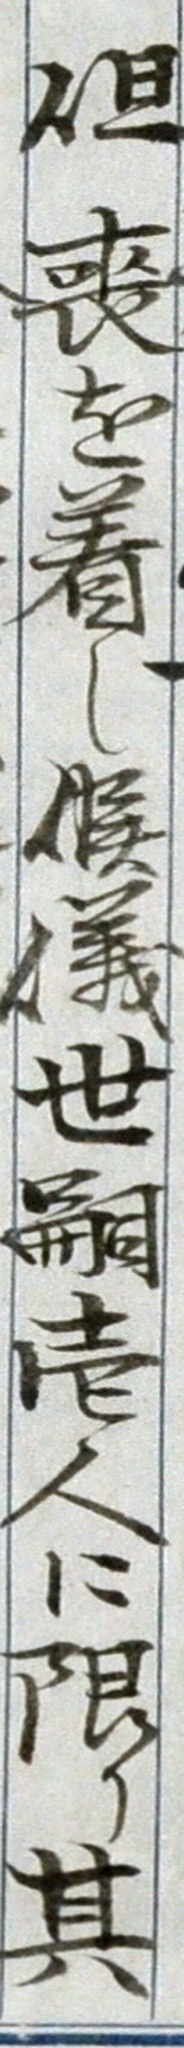但喪を着し候儀世嗣壱人に限り其
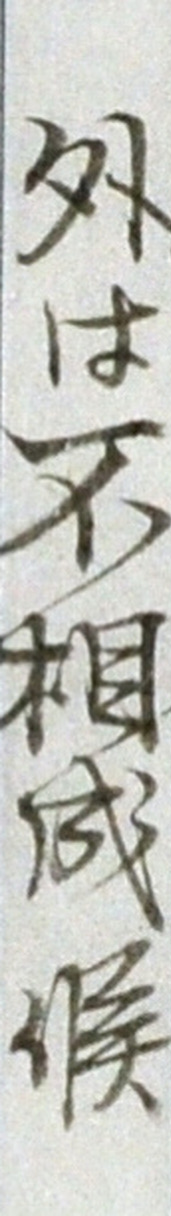外は不相成候
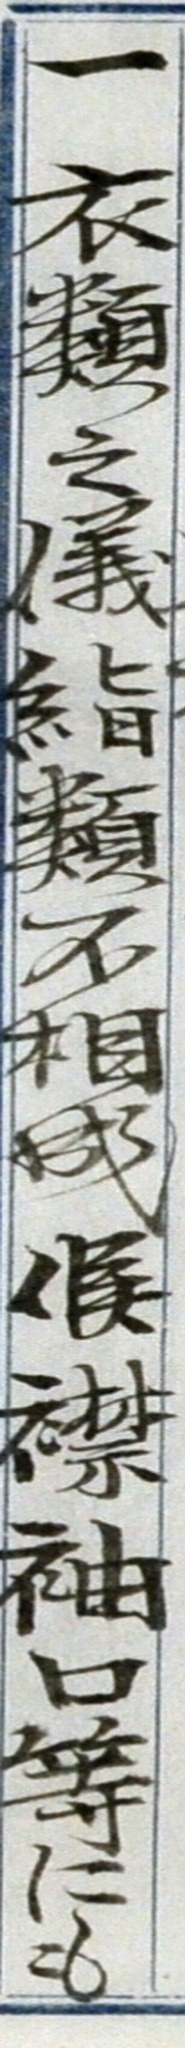一衣類之儀絹類不相成候襟袖口等にも
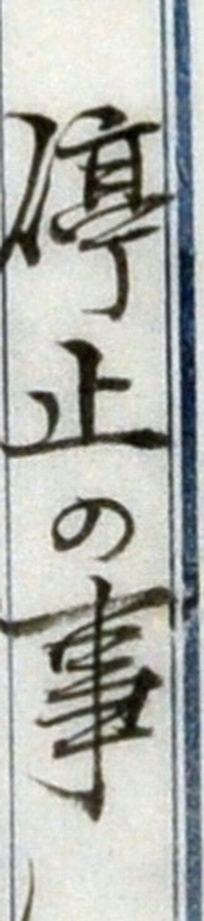停止の事
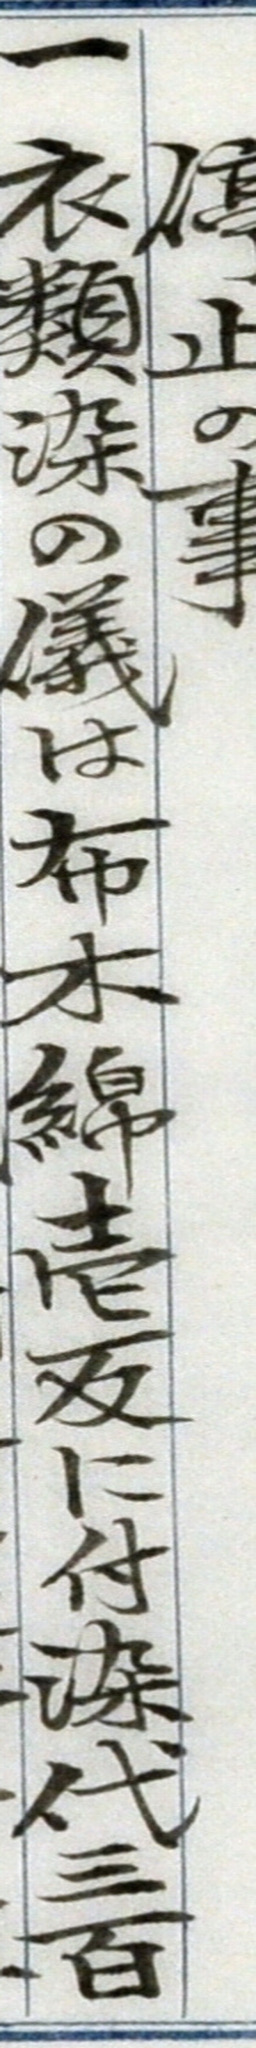一衣類染の儀は布木綿壱反に付染代三百
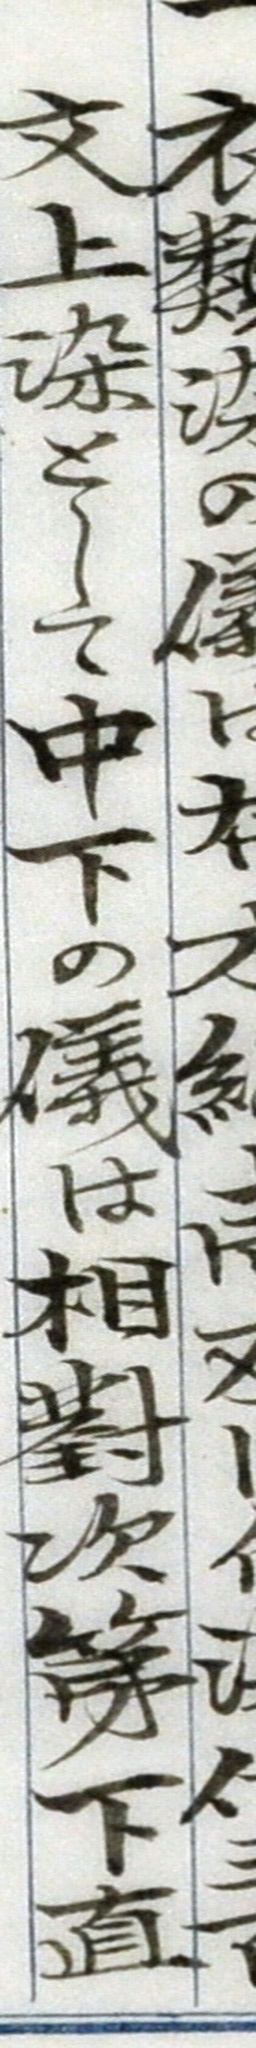文上染として中下の儀は相対次第下直
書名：倹約筋御沙汰書
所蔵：伊那市立高遠町図書館・合同会社AMANE
